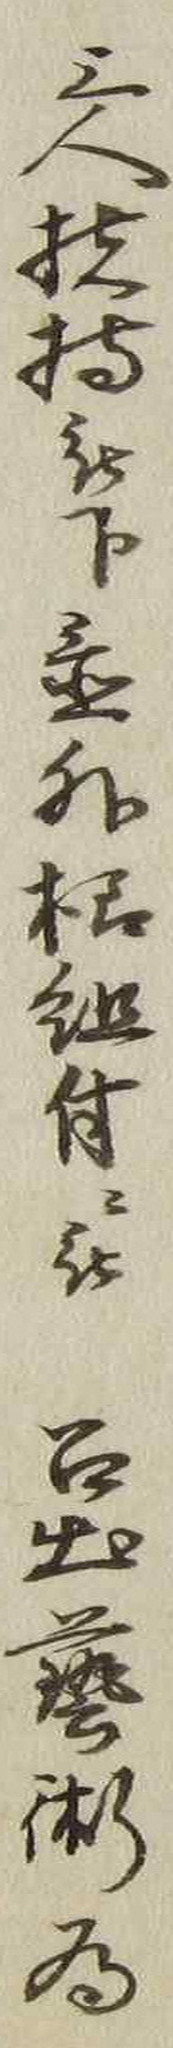三人扶持被下置外様組付ニ被召出芸術為
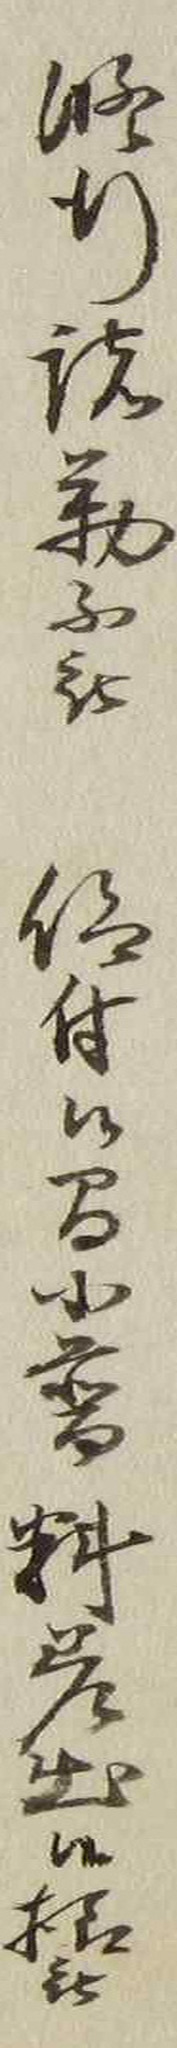修行諸勤ふ被仰付候間小普料差出候様被
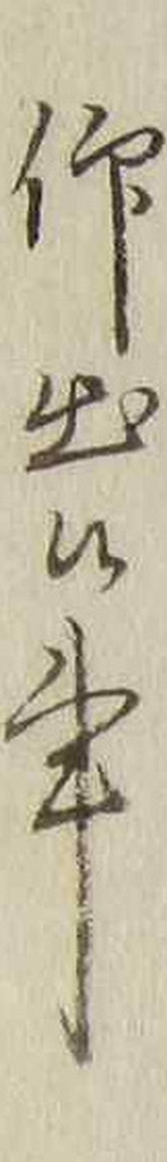仰出候事
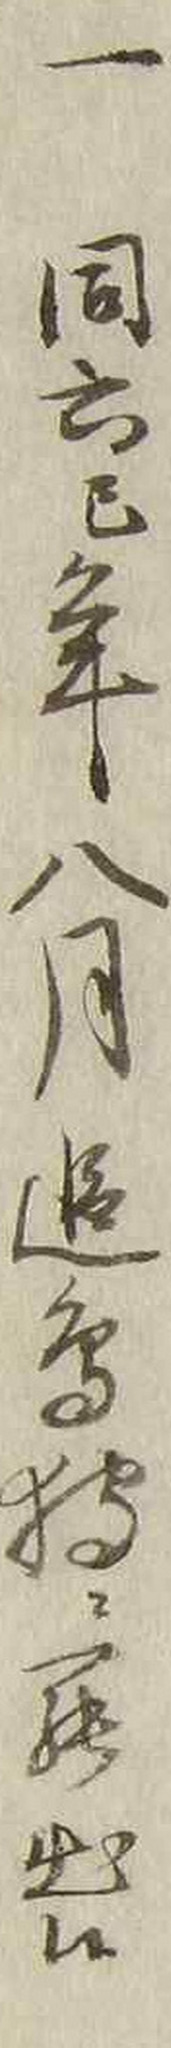一同六巳年八月追鳥狩ニ罷出候
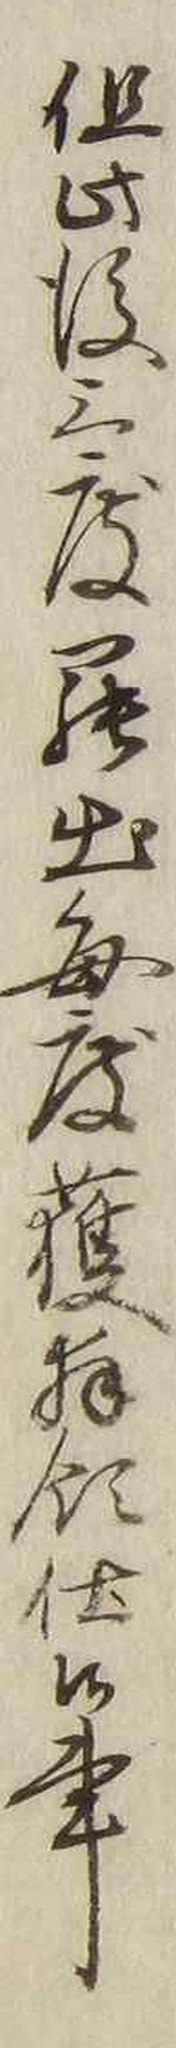但此後三度罷出毎度獲拝領仕候事

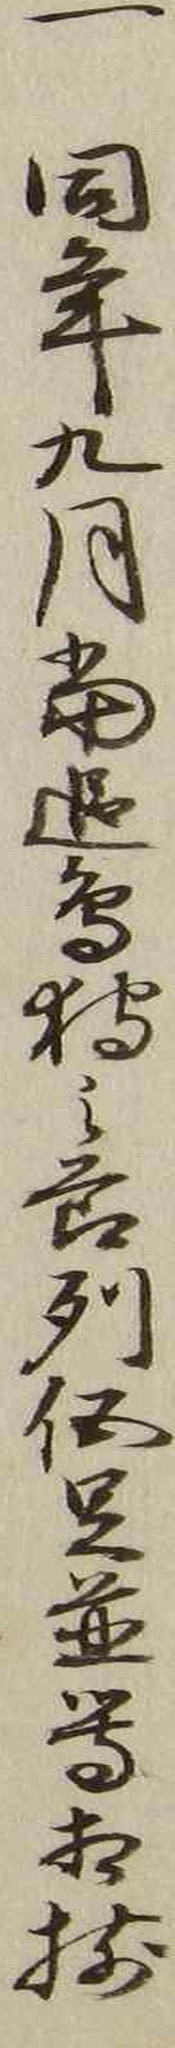一同年九月当追鳥狩之節列伍足並等相揃
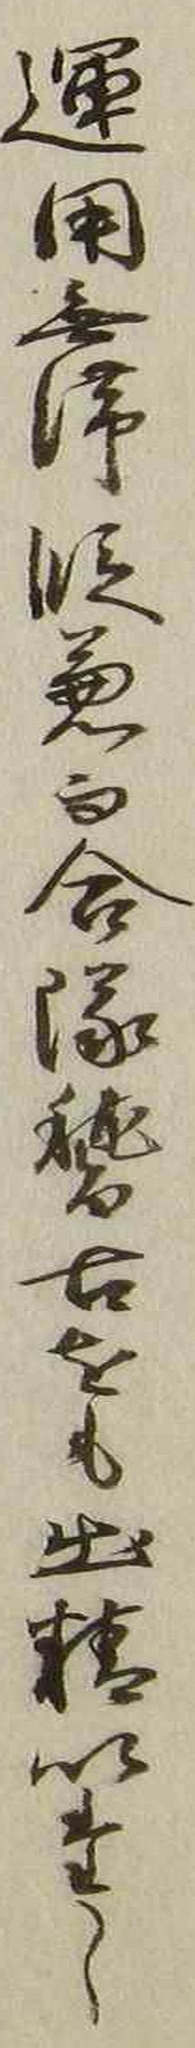運用無滞段兼而合隊稽古をも出精いたし
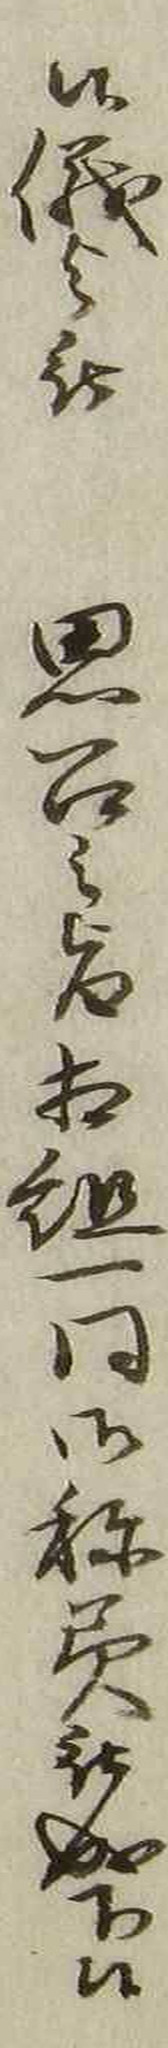候儀と被思召之旨相組一同御称美被成下候
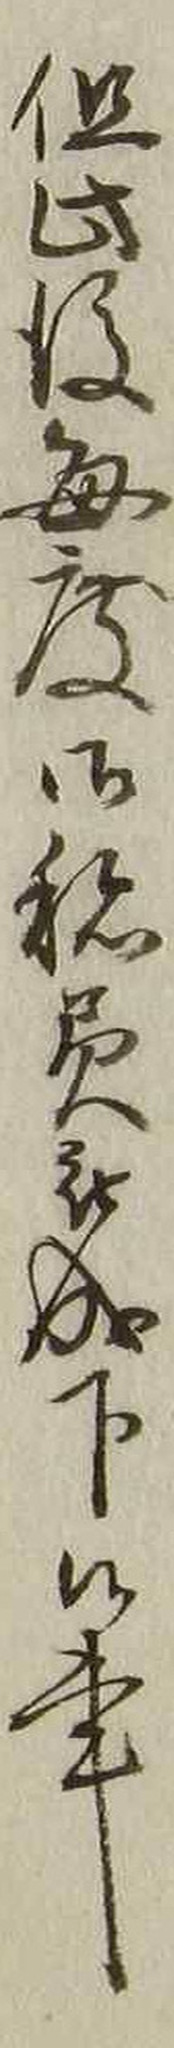但此後毎度御称美被成下候事
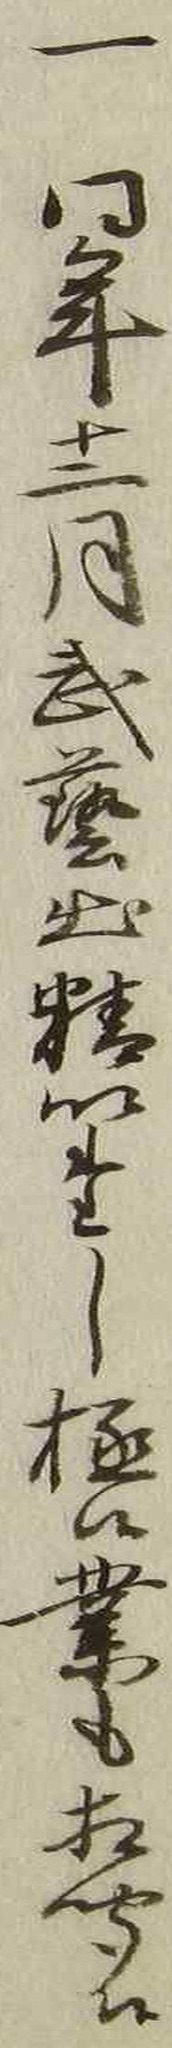一同年十二月武芸出精いたし様候業も相聞候
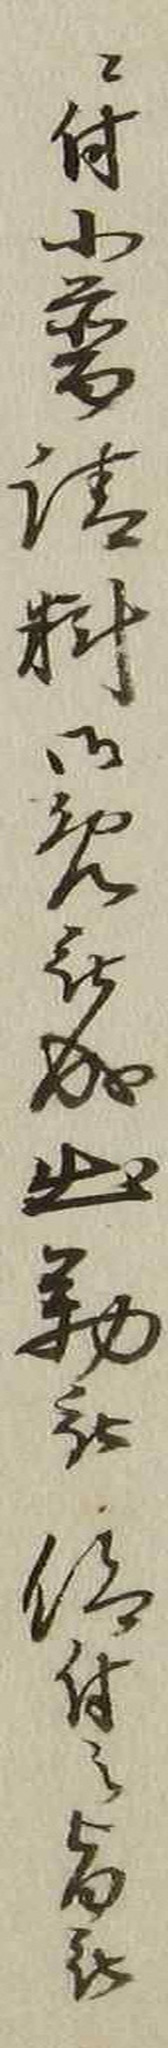ニ付小普請料御免被成出勤被仰付之旨被
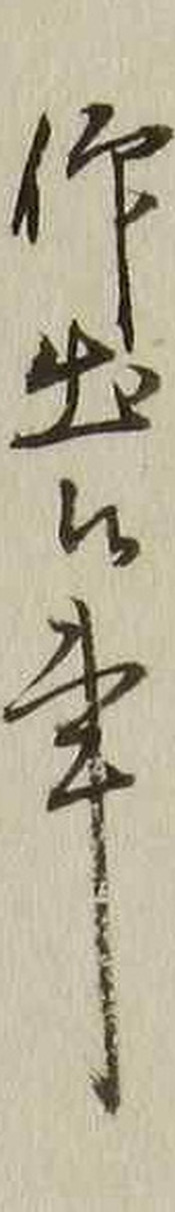仰出候事
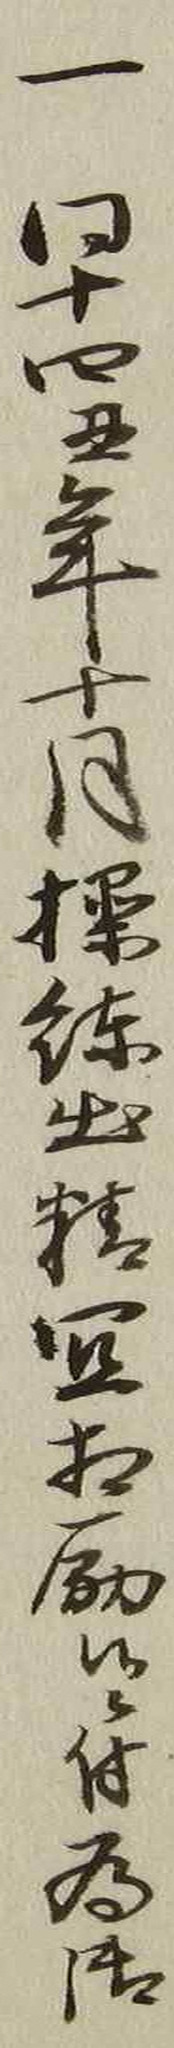一同十四丑年十月操練出精宜相励候ニ付為御
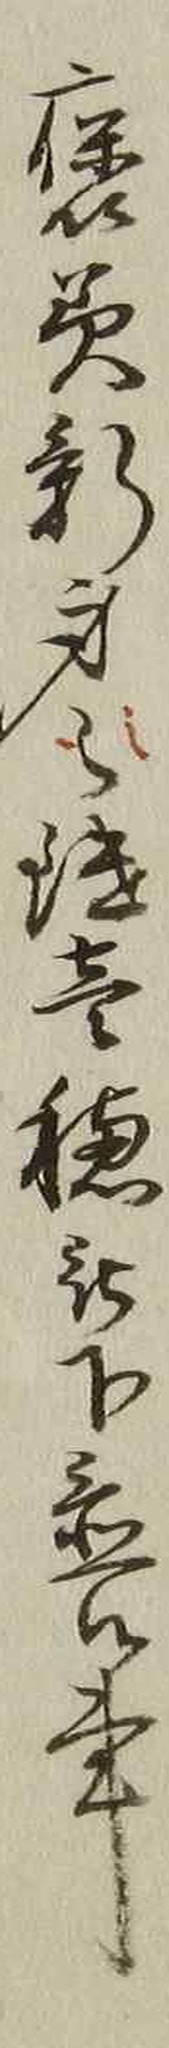褒美新身之鑓壱穂被下置候事
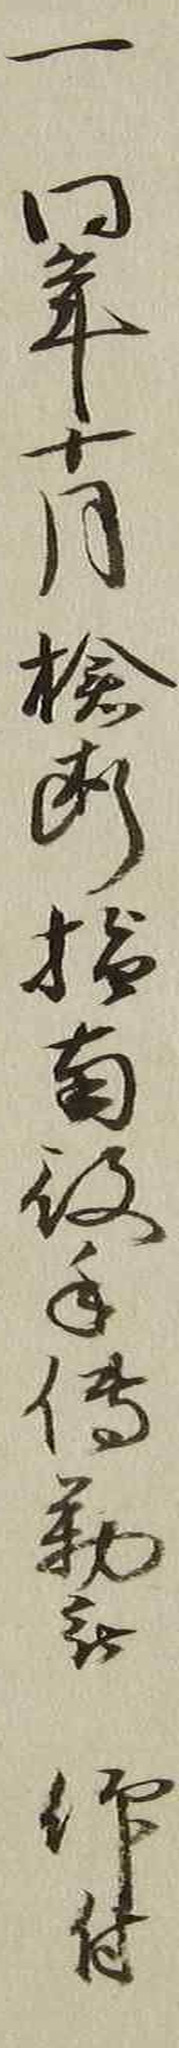一同年十月槍術指南役手伝勤被仰付
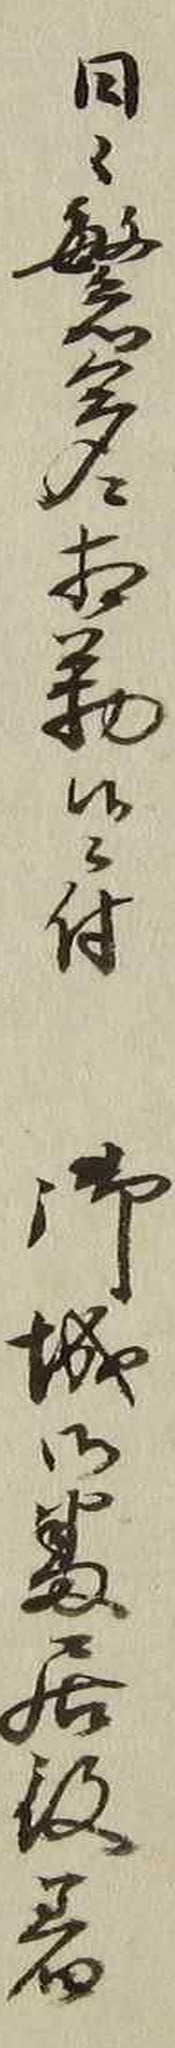日々繁多ニ相勤候ニ付御城御番居役着
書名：諸士系譜　巻之114　か之部22
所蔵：会津若松市立会津図書館
